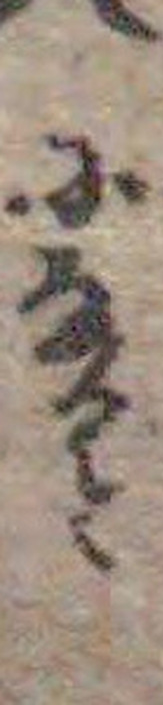になると

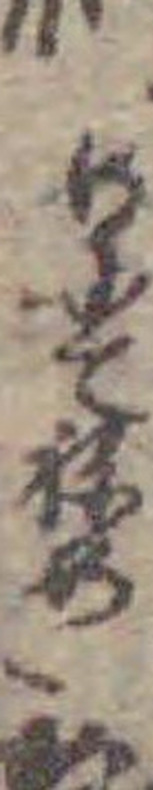めにてねめ
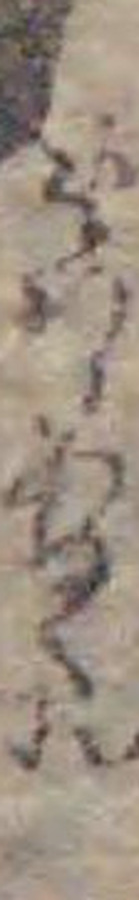まはしあるくに
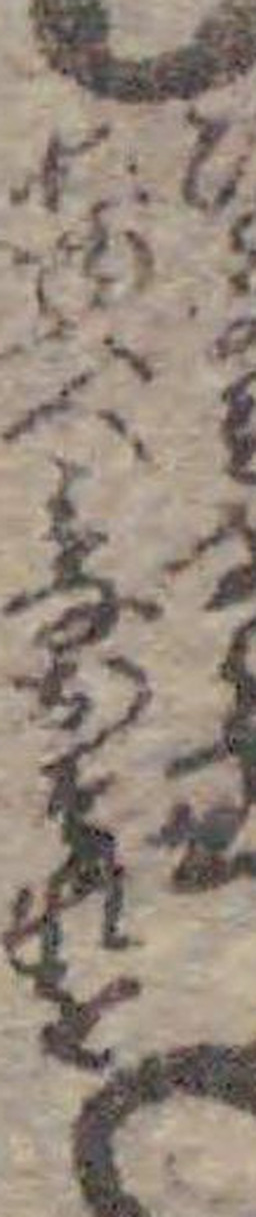ゆへ人みなおそれを
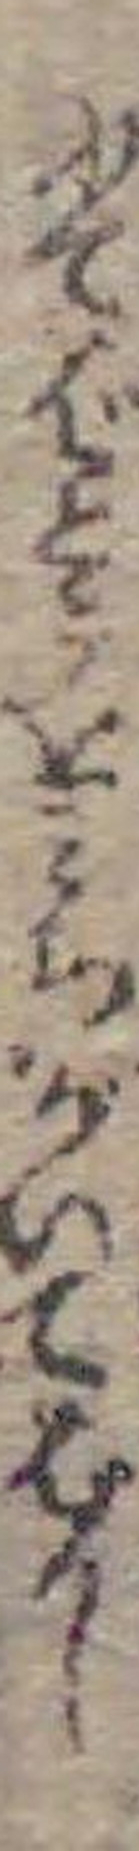にてばとうをみちがいてはかし
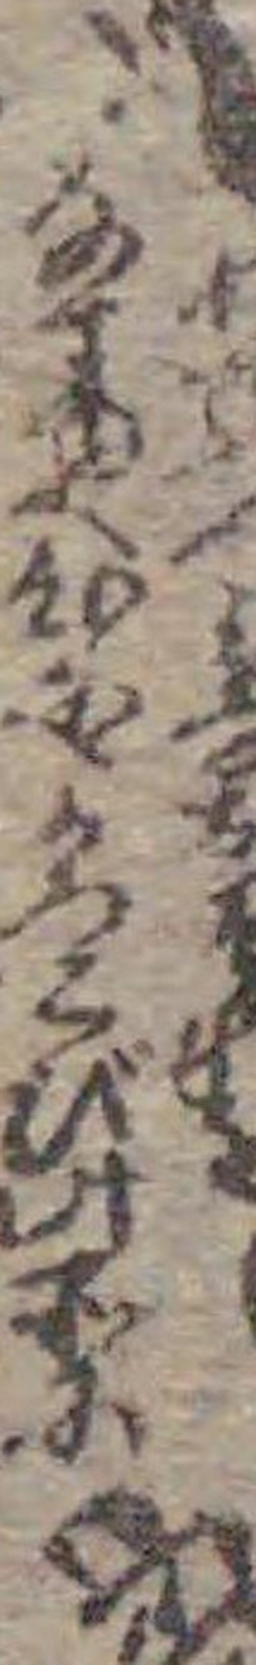なすゆへ心によろこび此所に
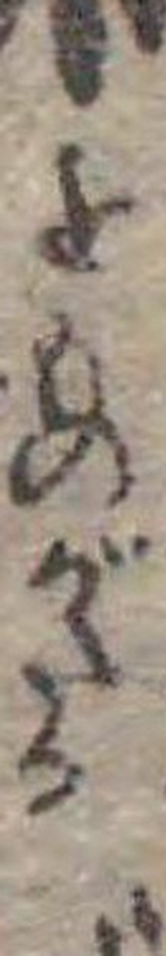ものがたる
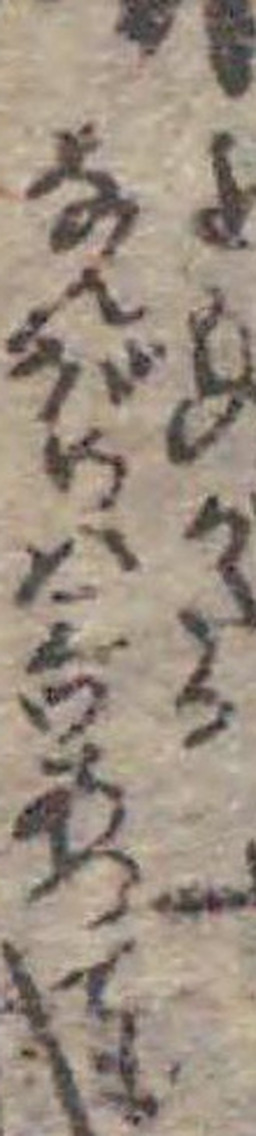なんぼめは三つあつても
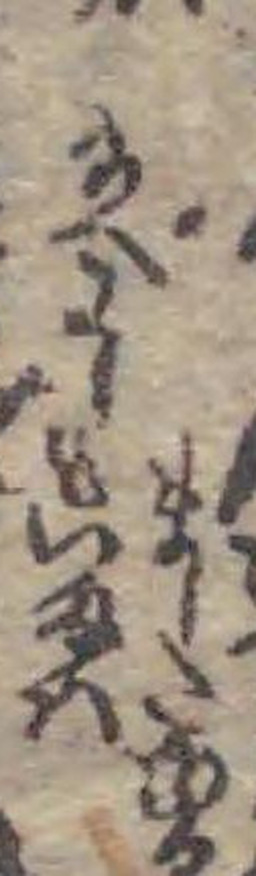給へわしもいまは
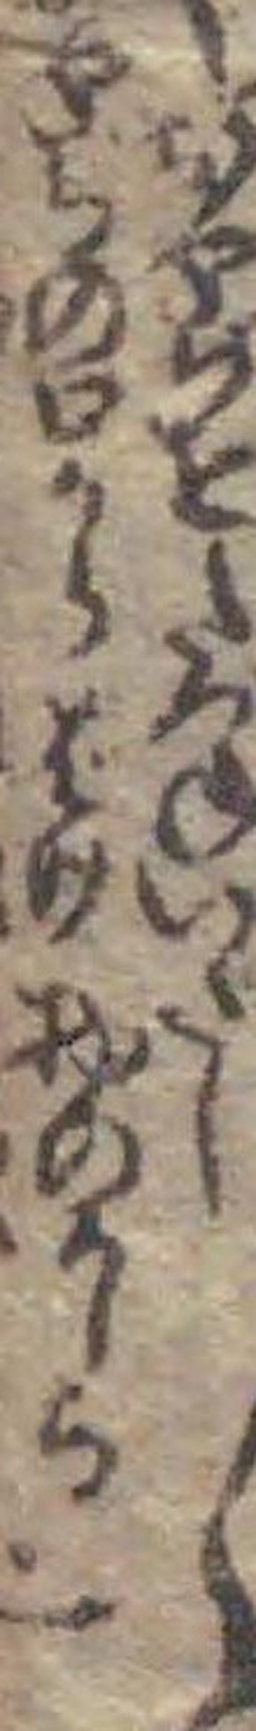おやぢの口からばけ物のかしら
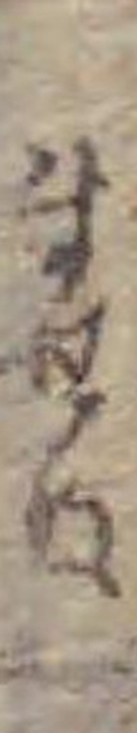ませぬ
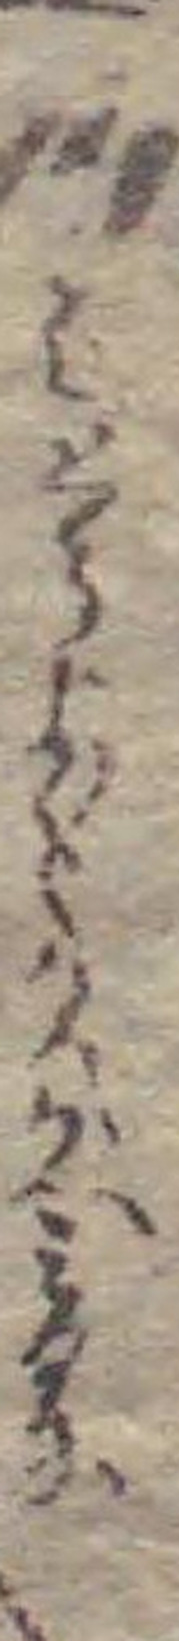はとうよく〳〵かんかへみるに
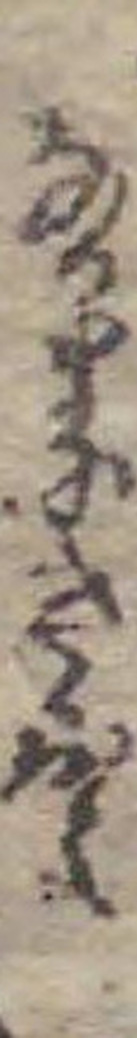なかまにきゝおよ
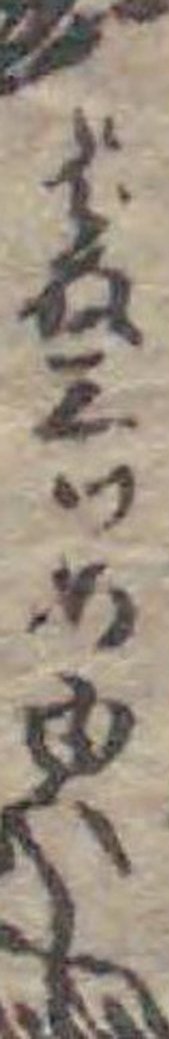はぬ三つめゆへ
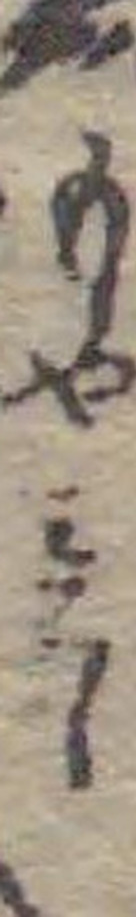もしやみこし
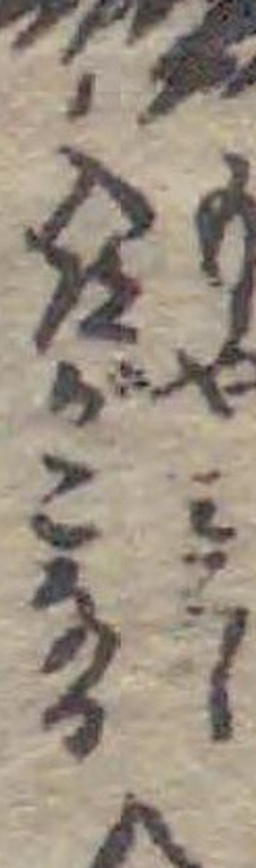入道がこなる
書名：[化物一代記] : 5巻
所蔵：国立国会図書館 National Diet Library, JAPAN
